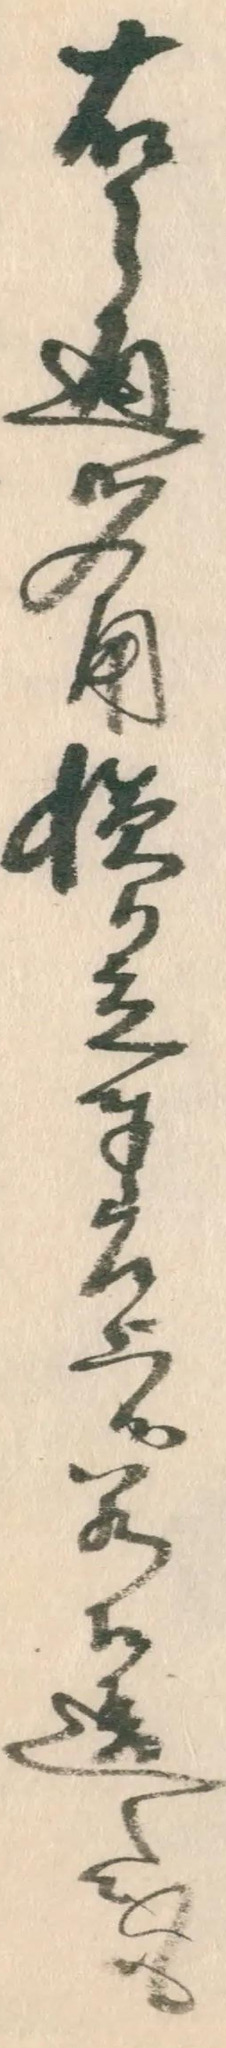右之通御入用積り立奉差上候若相違之義も
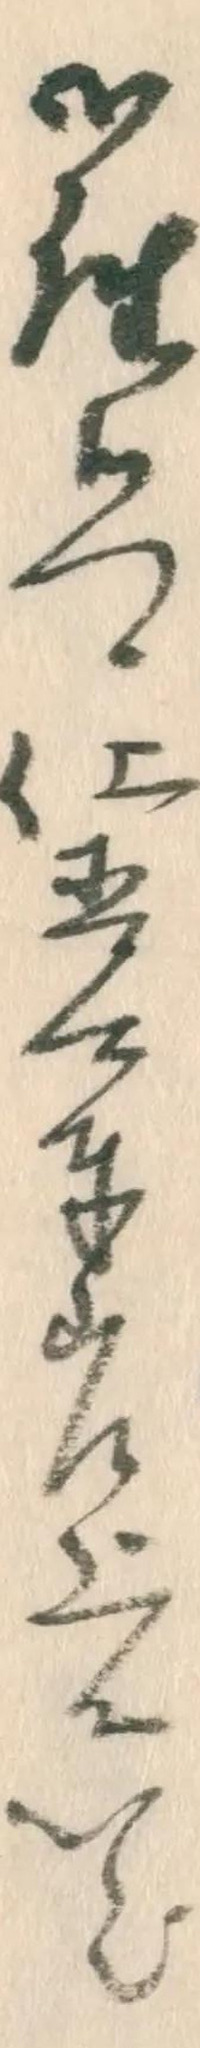御座候ハヽ仕直可奉差上候以上

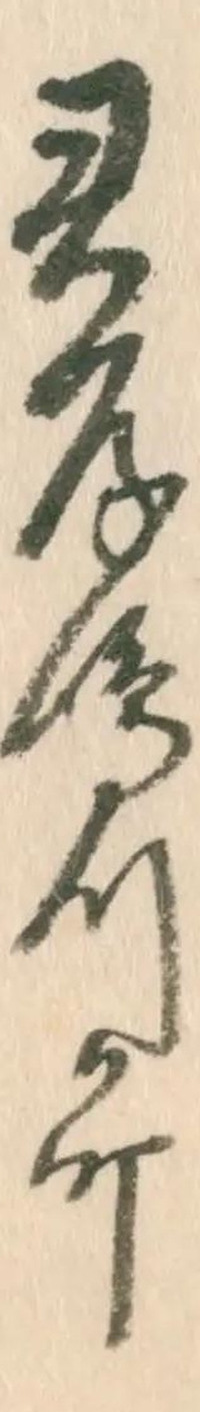霊岸島川口町
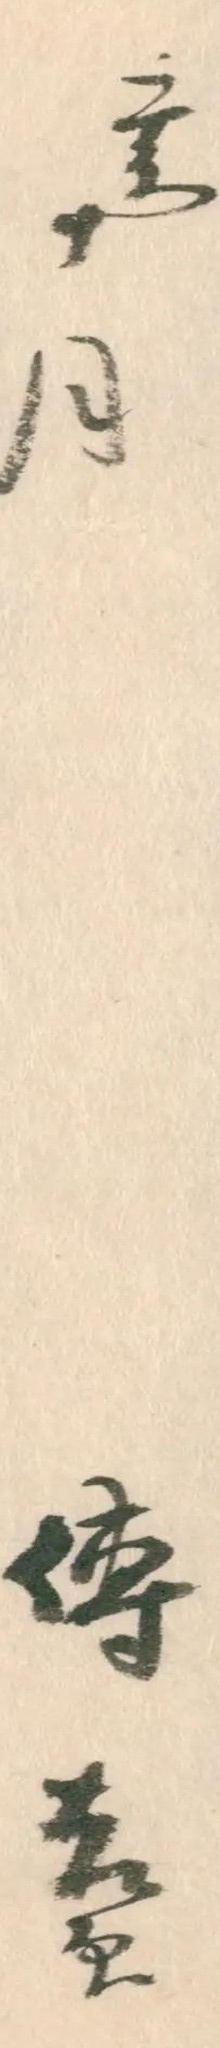亥十月伝吉印
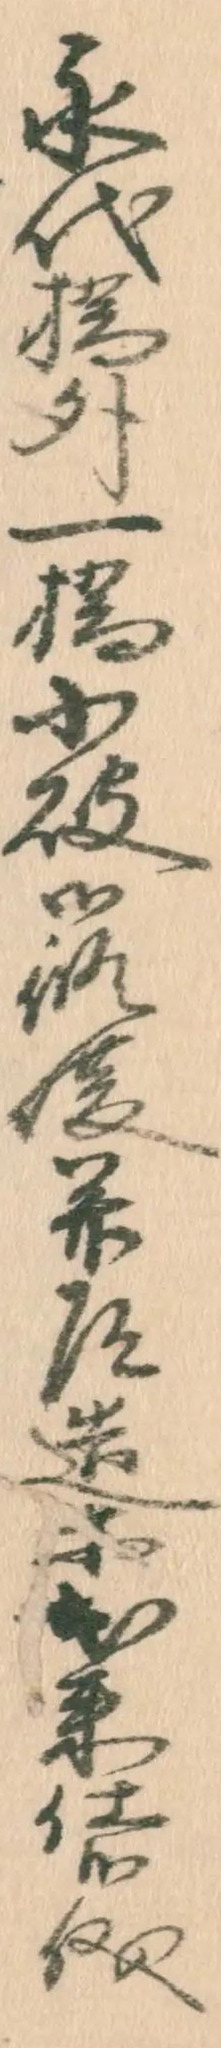永代橋外一橋小破御修復并道造等出来仕候儀
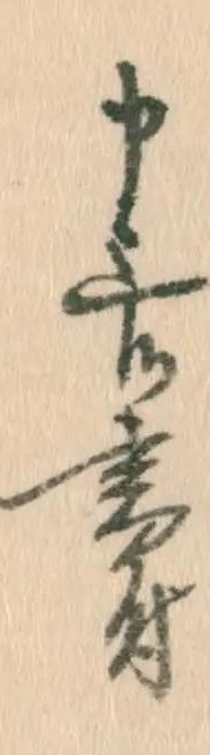申上候書付
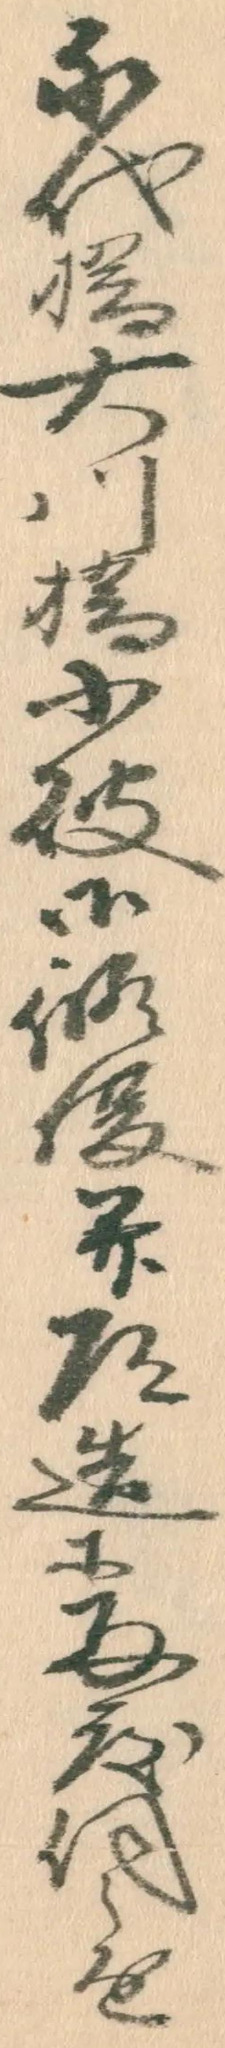永代橋大川橋小破御修復并道造等両度伺之通
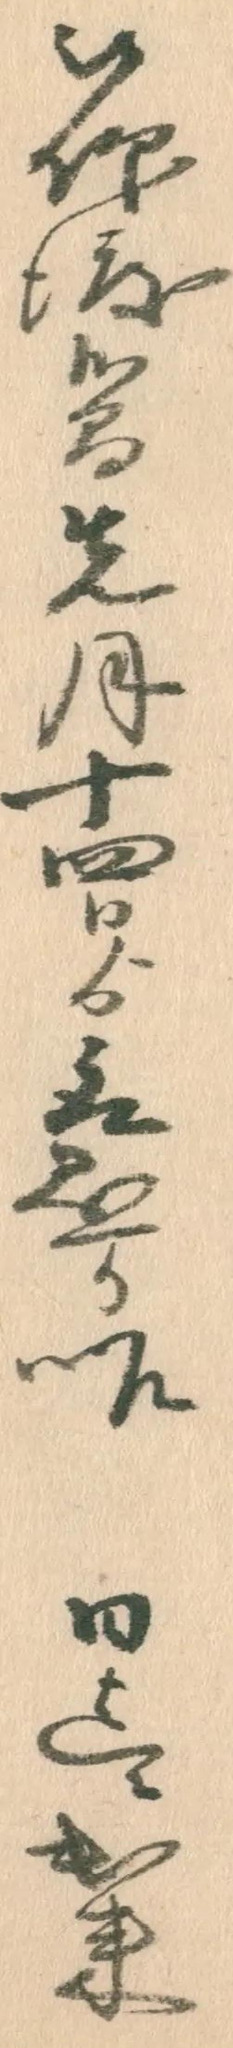被仰渡候間先月十四日ゟ取懸り昨日迄ニ出来
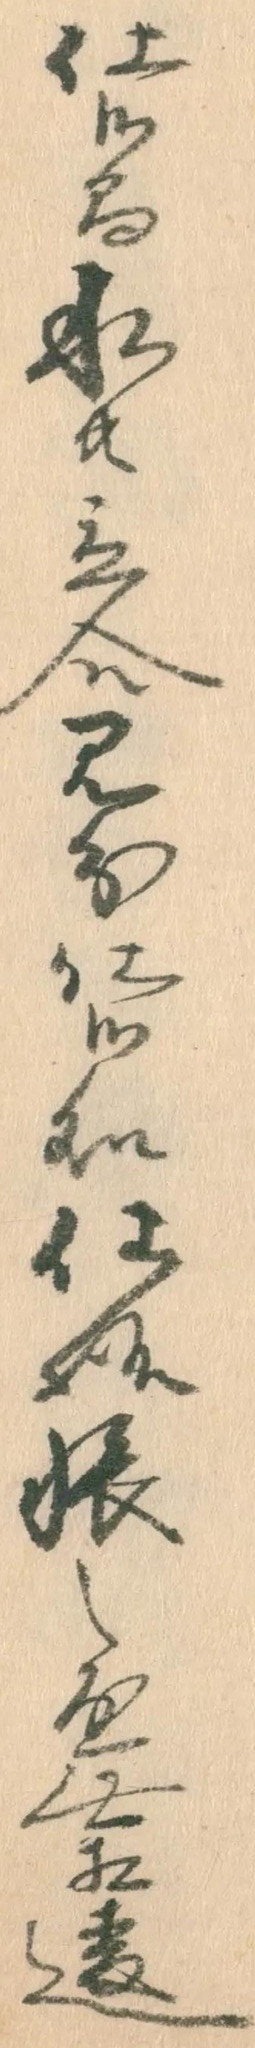仕候間私共立合見分仕候処仕様帳之通無相違

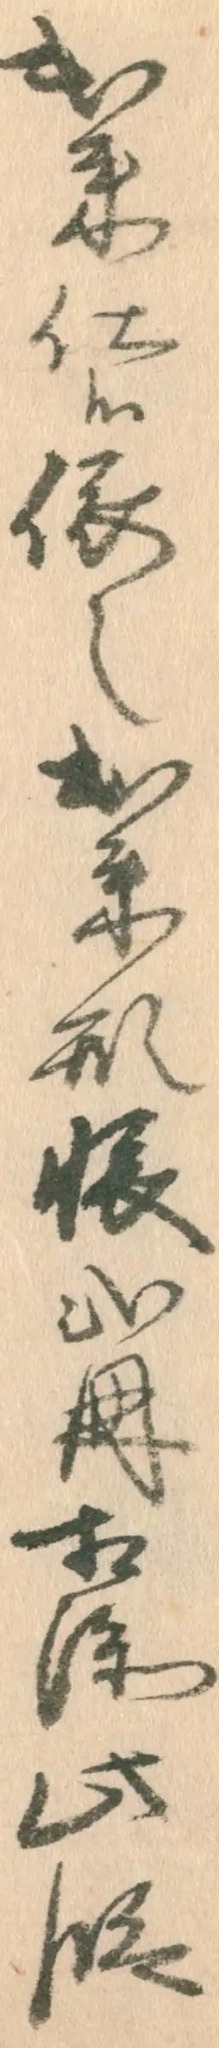出来仕候依之出来形帳弐冊相添此段
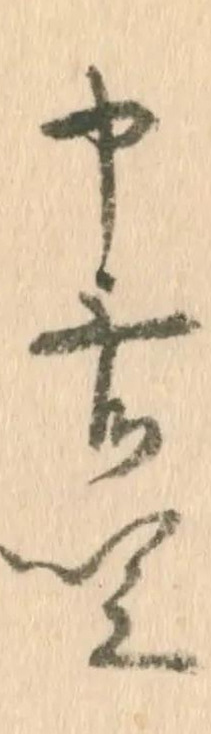申上候以上
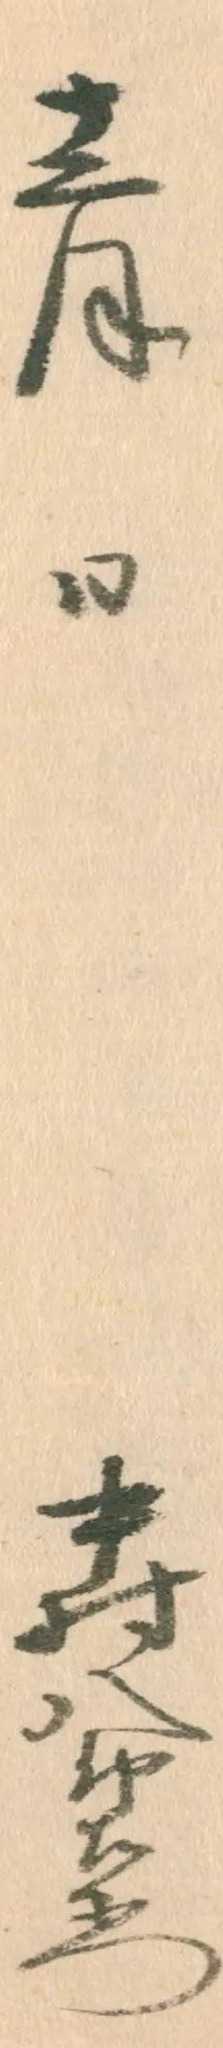十二月日中村八郎左衛門
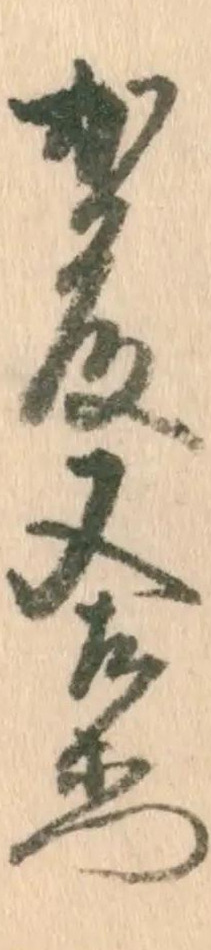加藤又左衛門
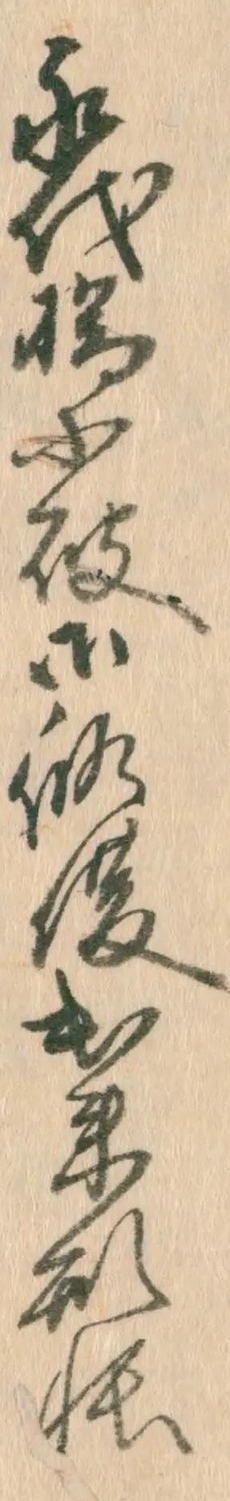永代橋小破御修復出来形帳
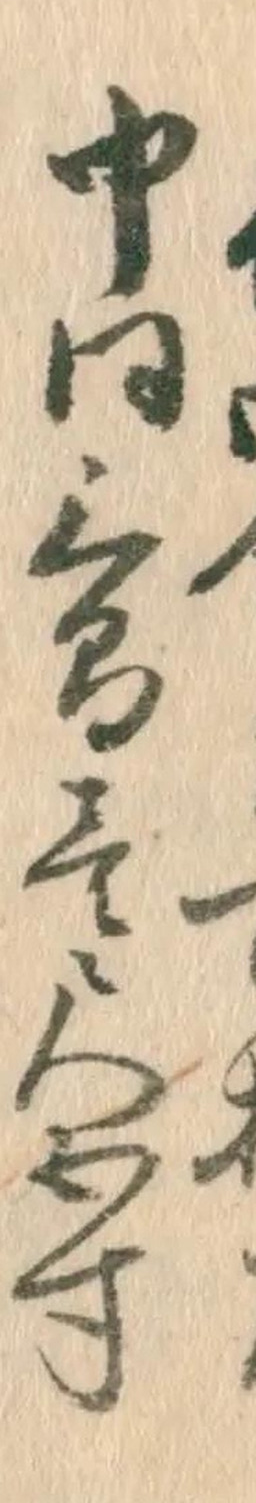巾同三間壱尺五寸
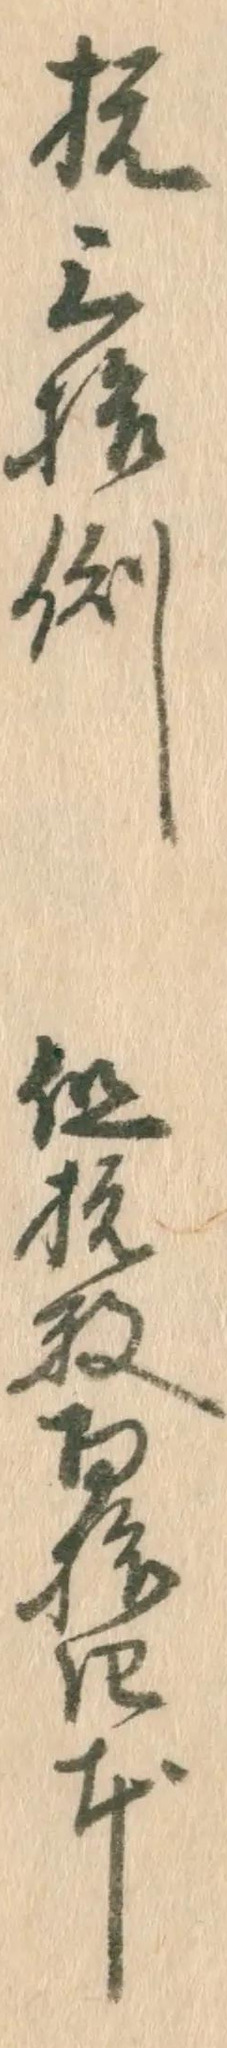杭三拾側但杭数百拾四本
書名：三橋 17巻. [7] 三橋小破御修復書留　但御奉行御掛リ替地震潰橋番屋　嘉永四亥年より安政二卯年迄　上
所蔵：国立国会図書館 National Diet Library, JAPAN
